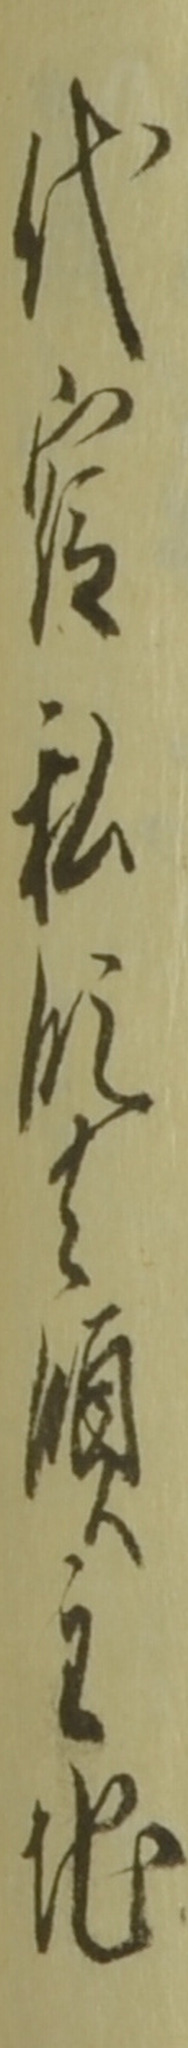代官私領は領主地
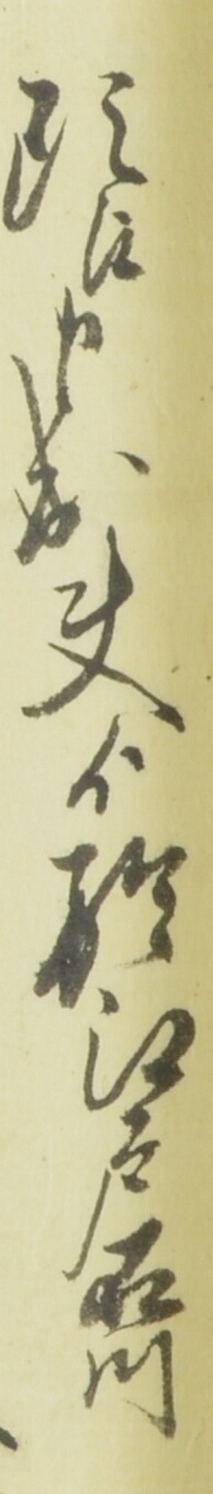頭江申出夫ゟ於江戸石
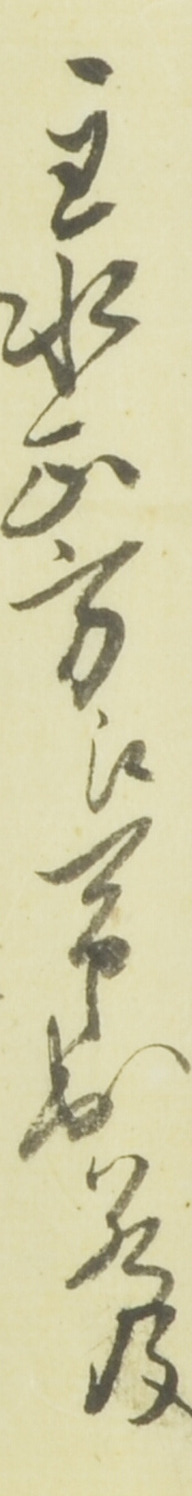主水正方江可申出若及
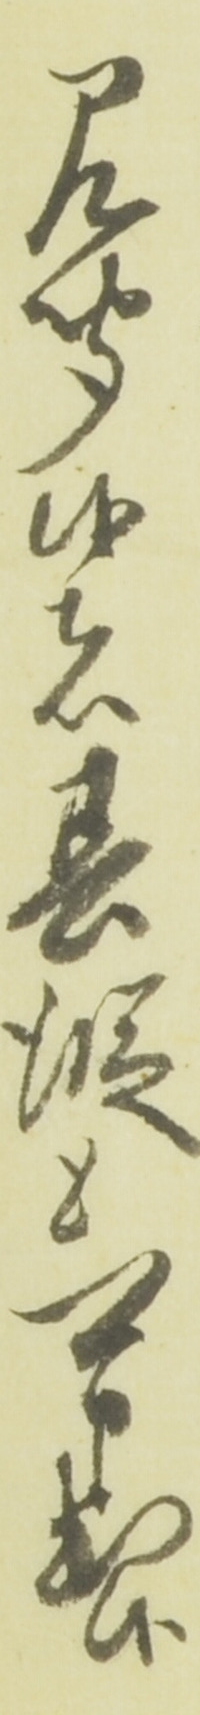見聞候者其段も可申出候
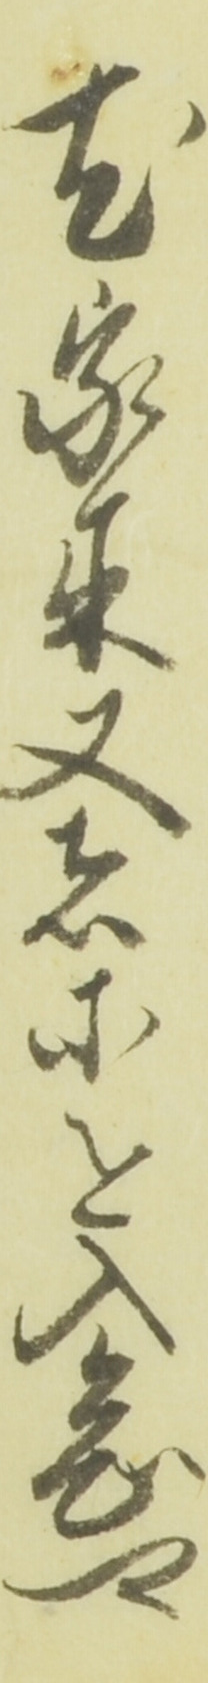尤家来又は等を入念可
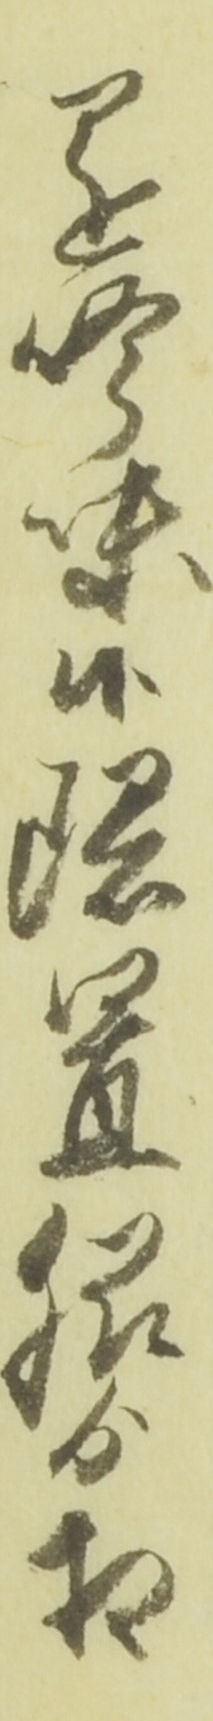遂吟味候隠置脇ゟ相
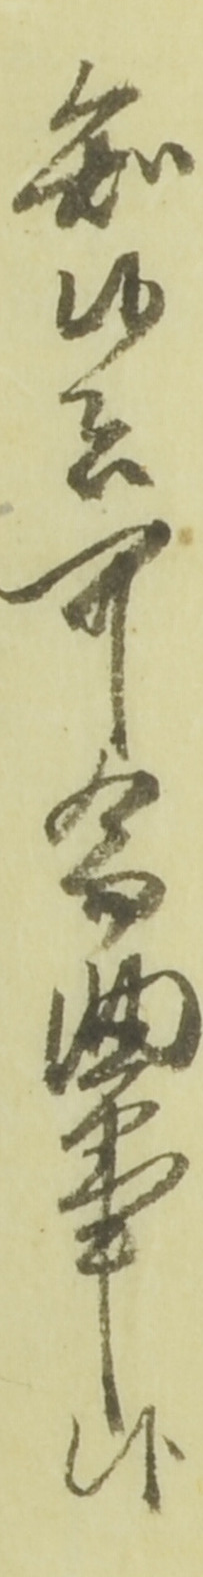知候は可為曲事候
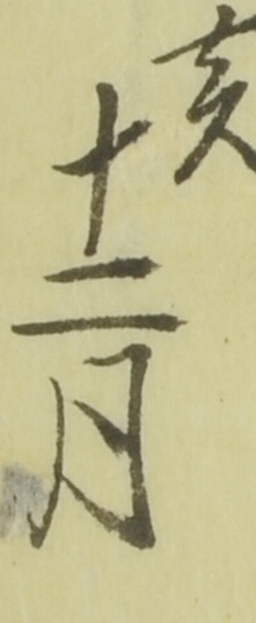十二月
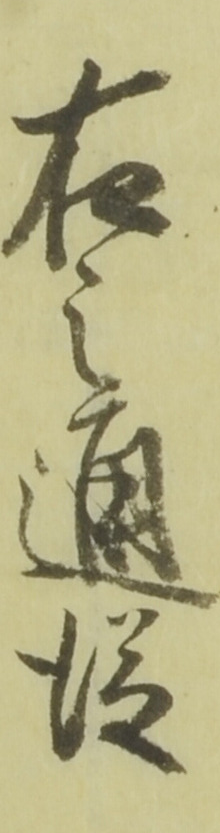右之通従
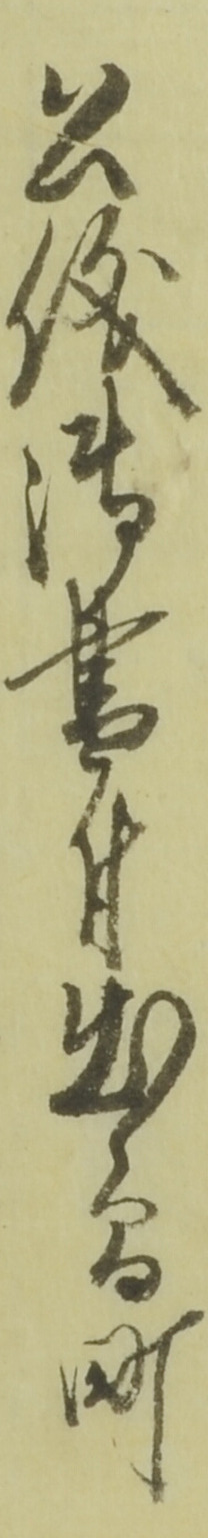公儀御書付出候間町
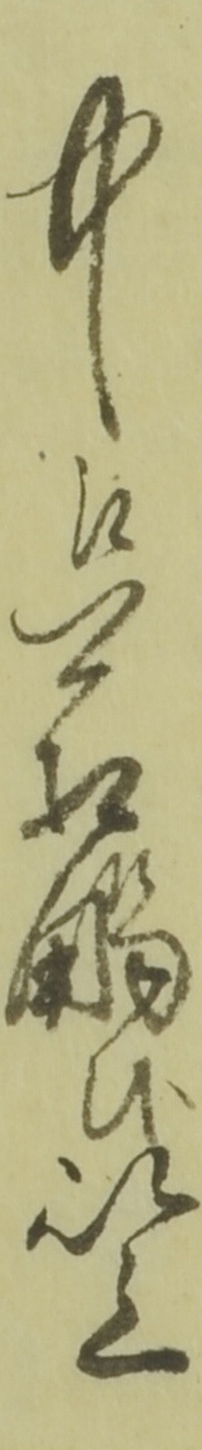中江可相触候以上
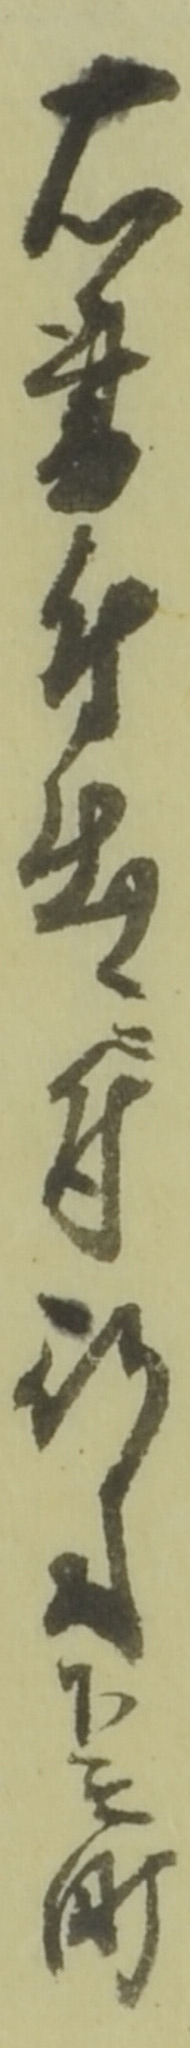右書付出候ニ付行司下モ町
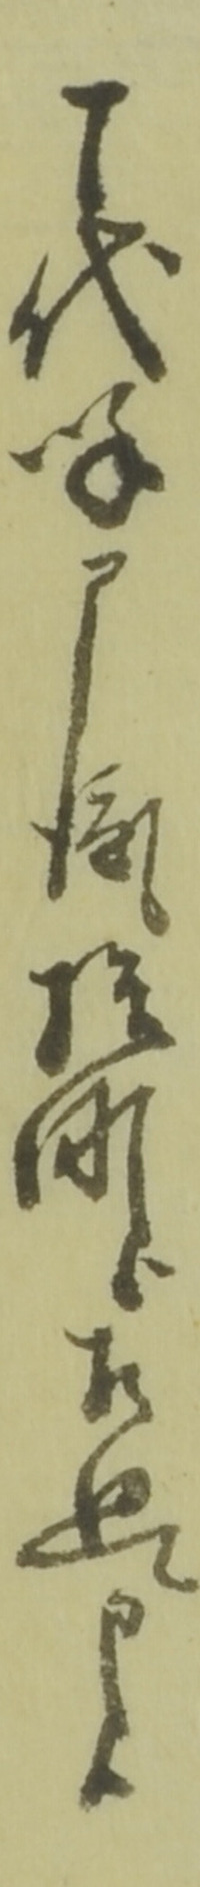丁代呼申渡候拾町ゟ相廻シ申候
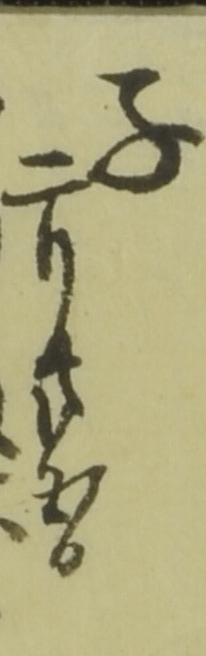二月廿五日
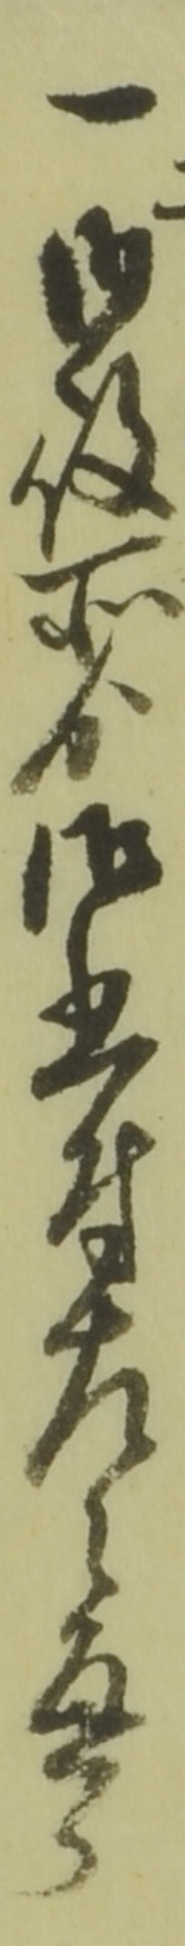一御役所ゟ御書付左之通り
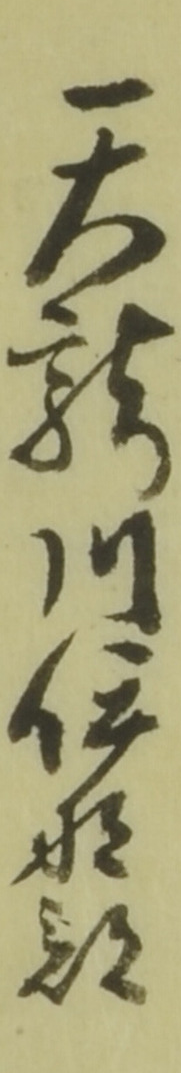天龍川伊那郡
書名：御触書御書附控
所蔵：伊那市立高遠町図書館・合同会社AMANE
